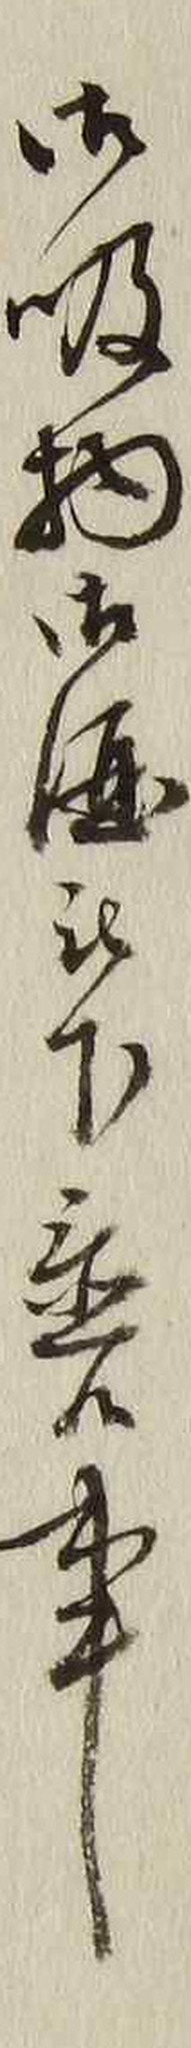御吸物御酒被下置候事
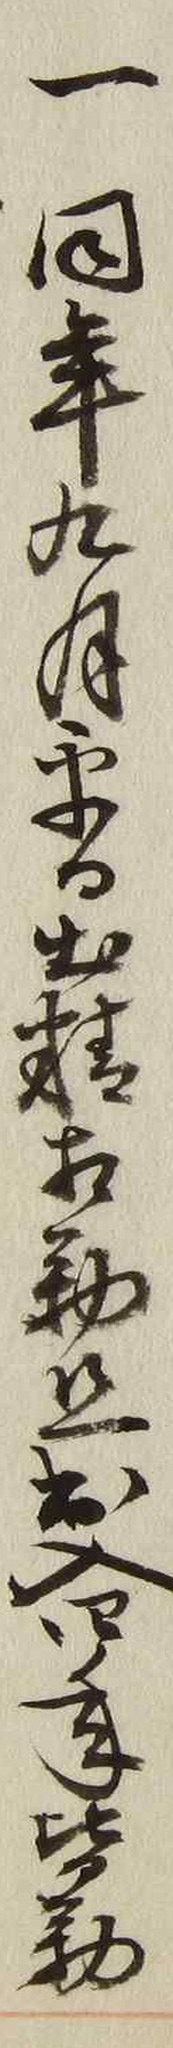一同年九月平日出精相勤旦出入四年皆勤
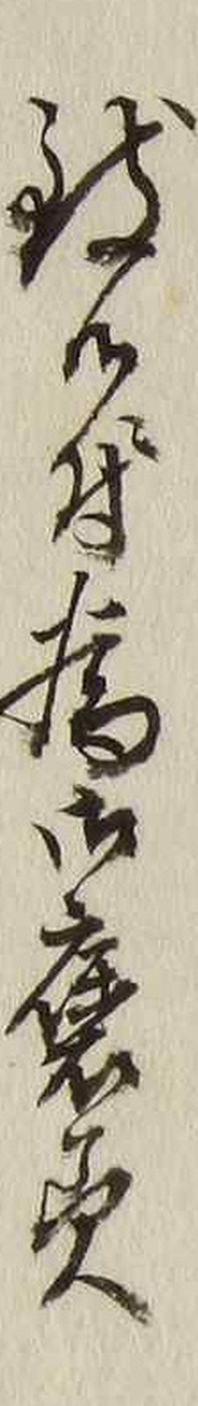致候ニ付為御褒美
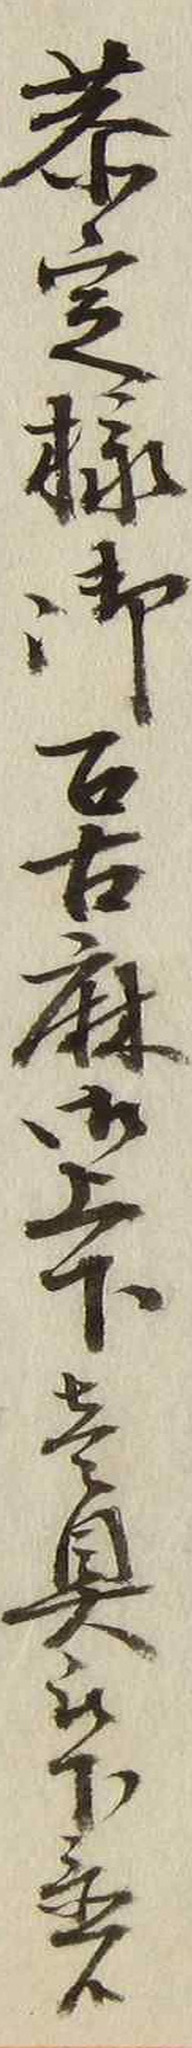恭定様御召古麻御上下壱具被下置候
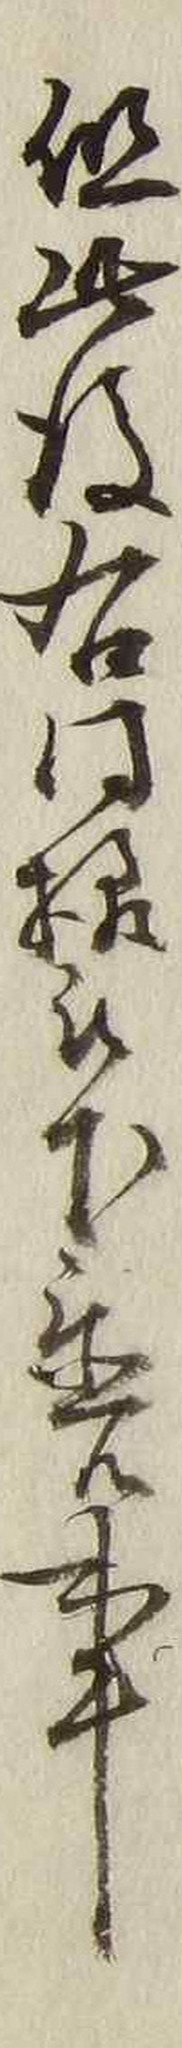但此後右同様被下置候事
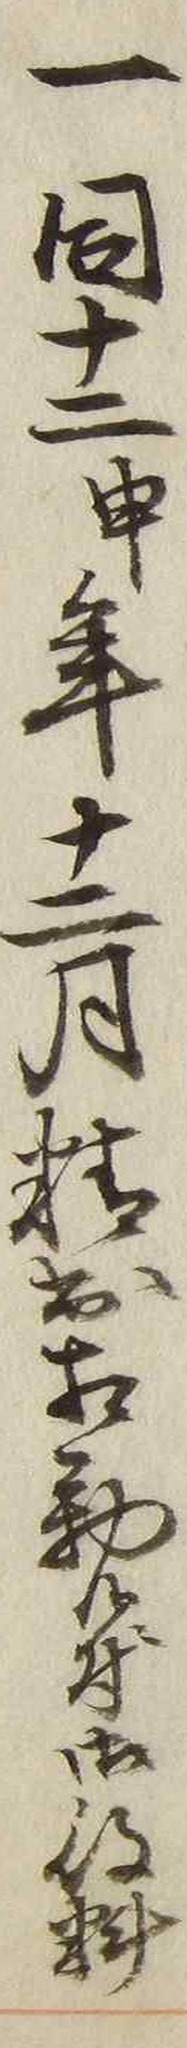一同十二申年十二月精出相勤候ニ付御役料

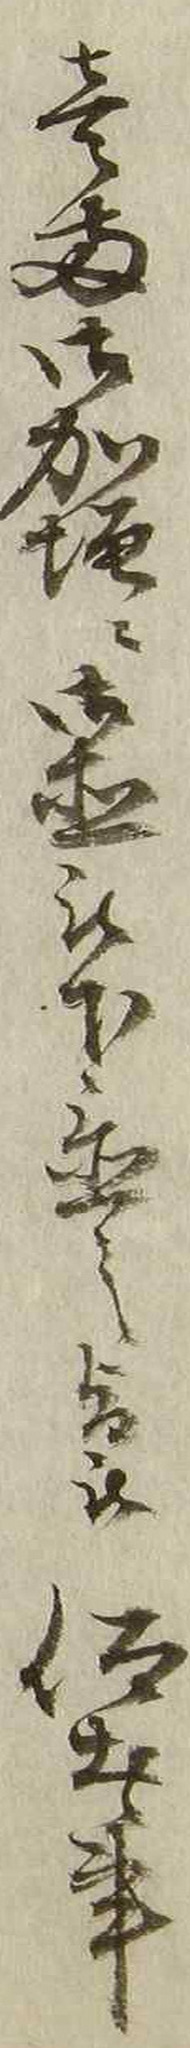壱両御加増ニ御直被下置之旨被仰出候事
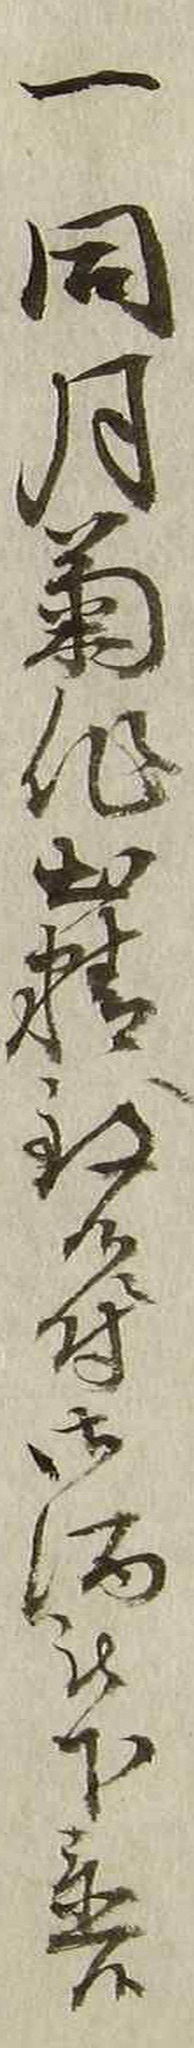一同月菊作出精致候ニ付御酒被下置候
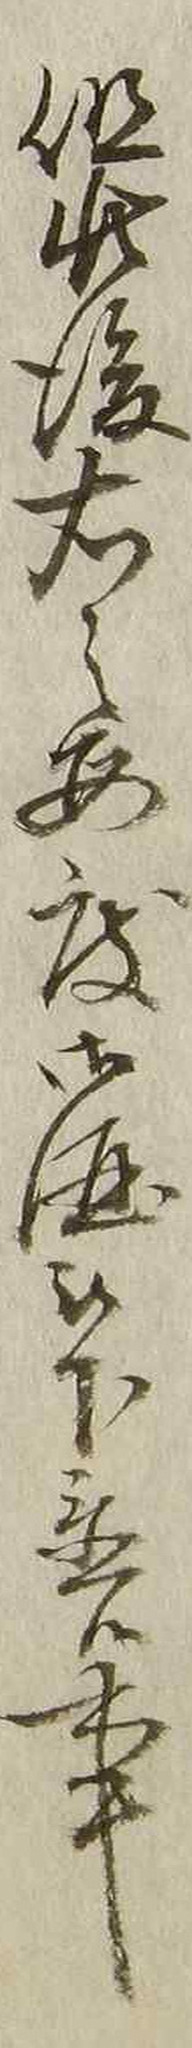但此後右之毎度御酒被下置候事
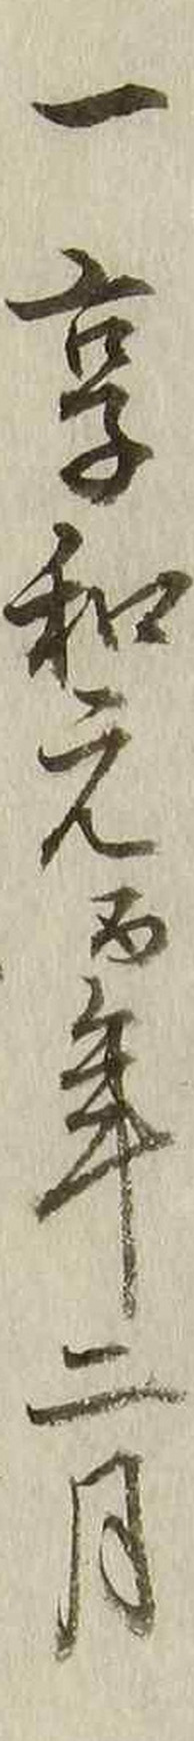一享和元酉年二月
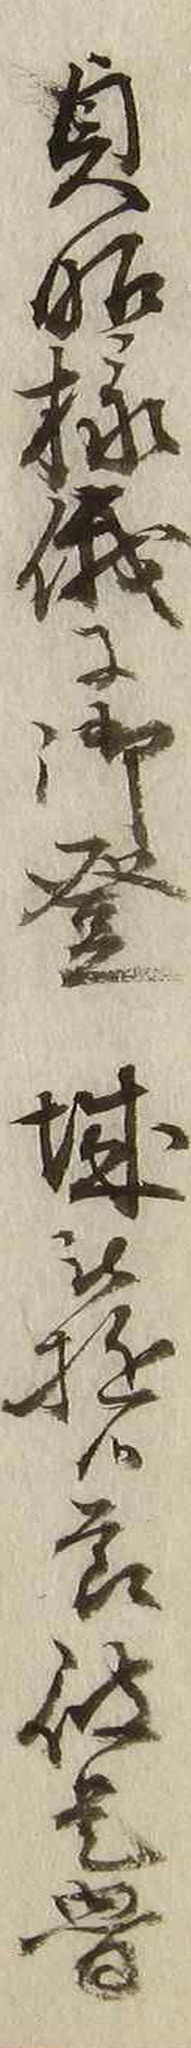貞昭様俄に御登城被遊候節彼是骨
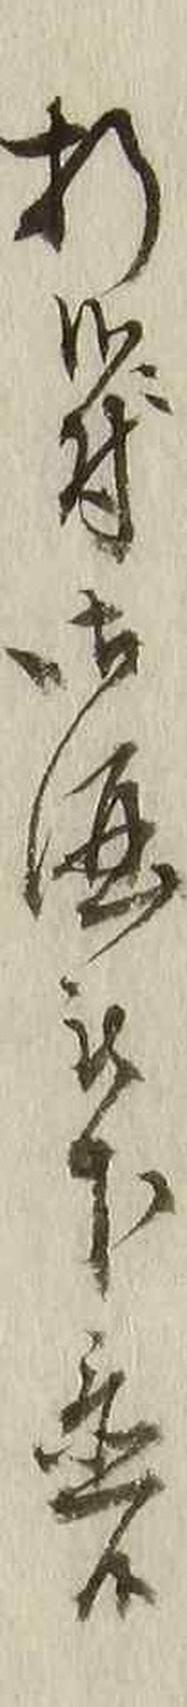折候ニ付御酒被下置候
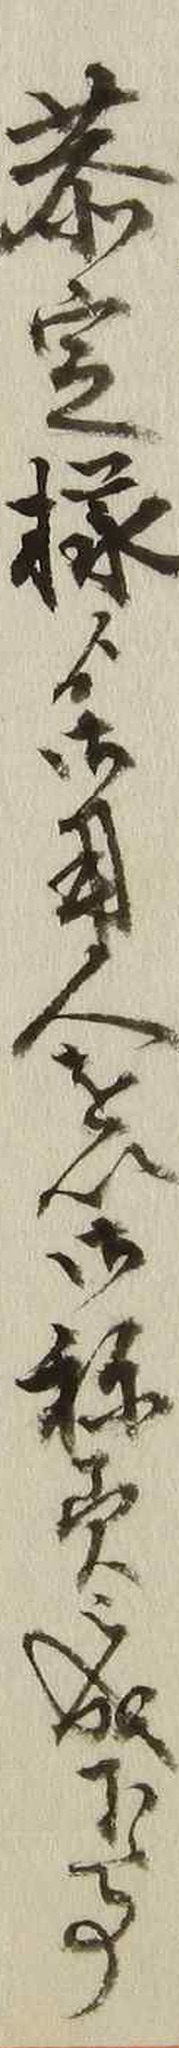恭定様ゟ御用人を以御称美被成下候事
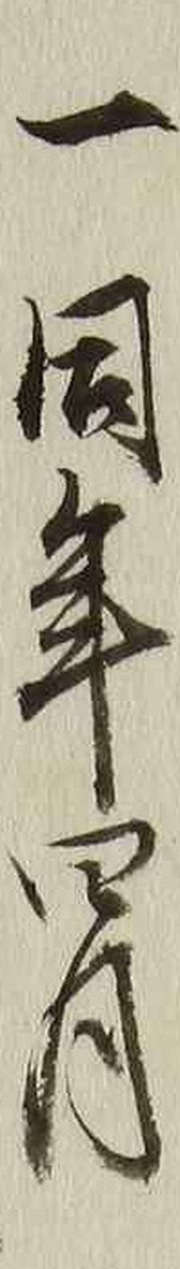一同年四月
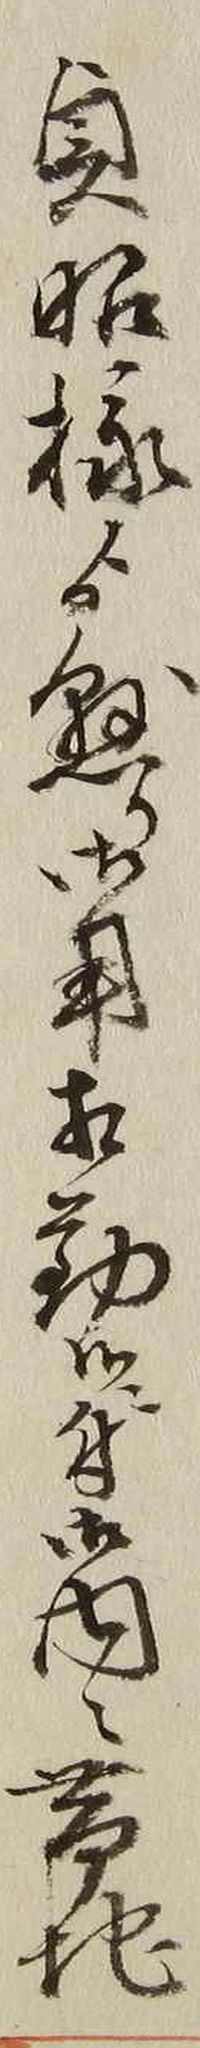貞昭様ゟ懸り御用相勤候ニ付御内々帯地
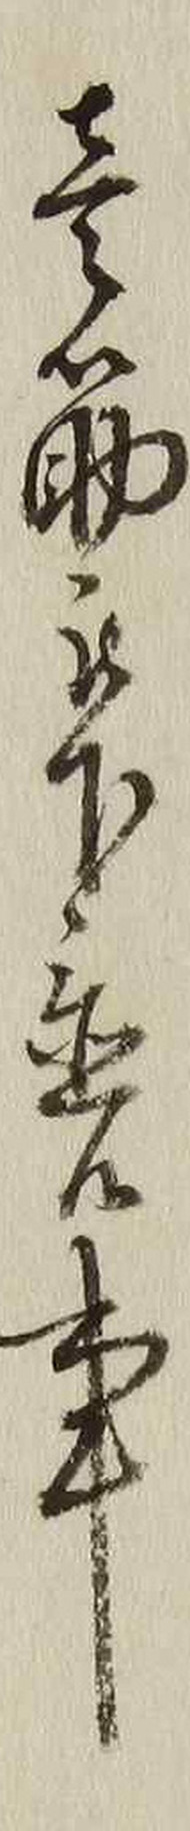壱筋被下置候事
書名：諸士系譜　巻之23　い之部23
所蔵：会津若松市立会津図書館
